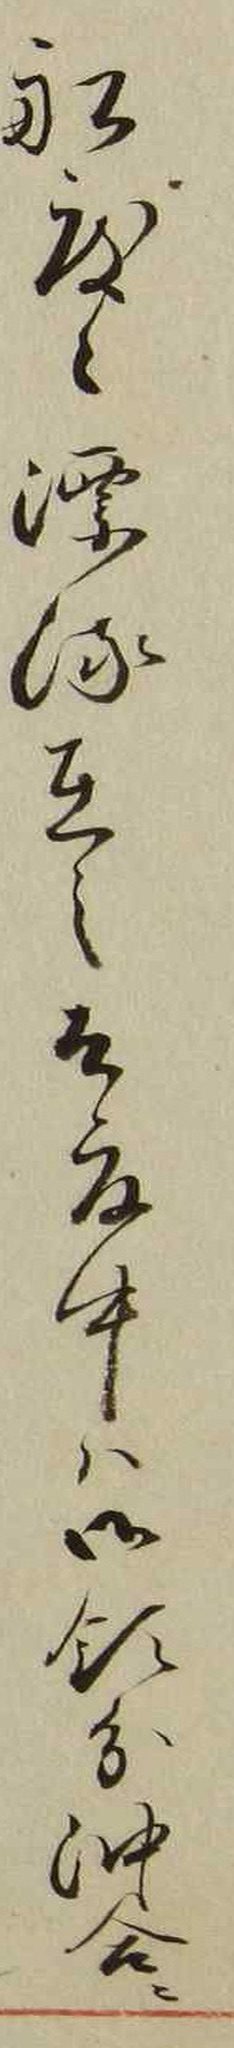船度々漂流在之去夏中は御領分沖合に
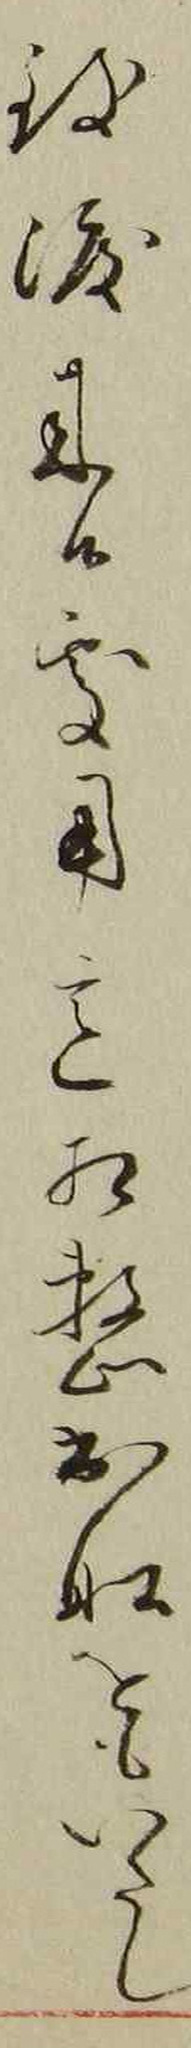致渡来候処用意相整出船をもいたし
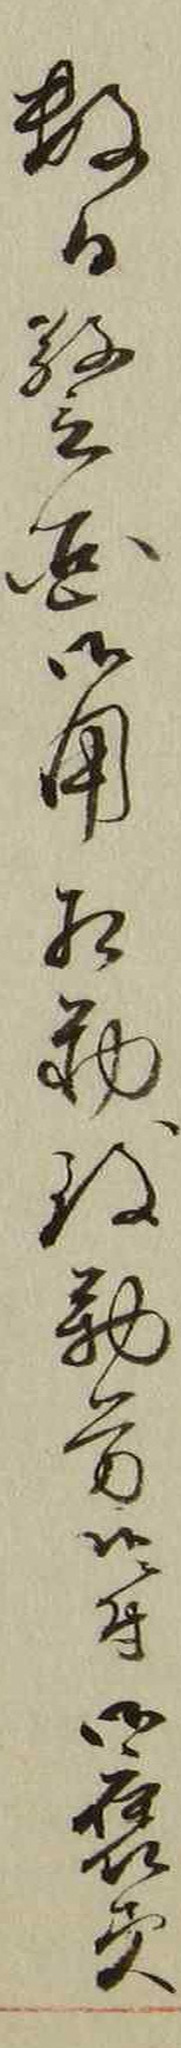数日警固御用相勤致勤労候に付御褒美
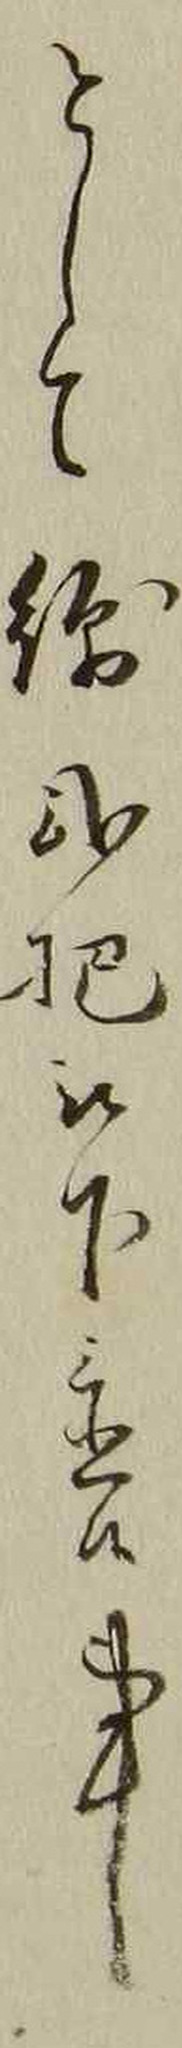として綿弐把被下置候事
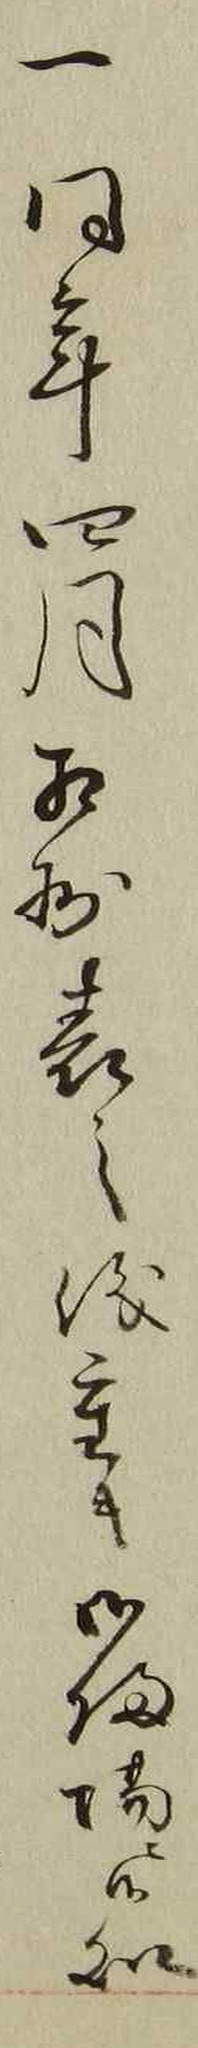一同年四月相州表之儀重キ御備場に候処
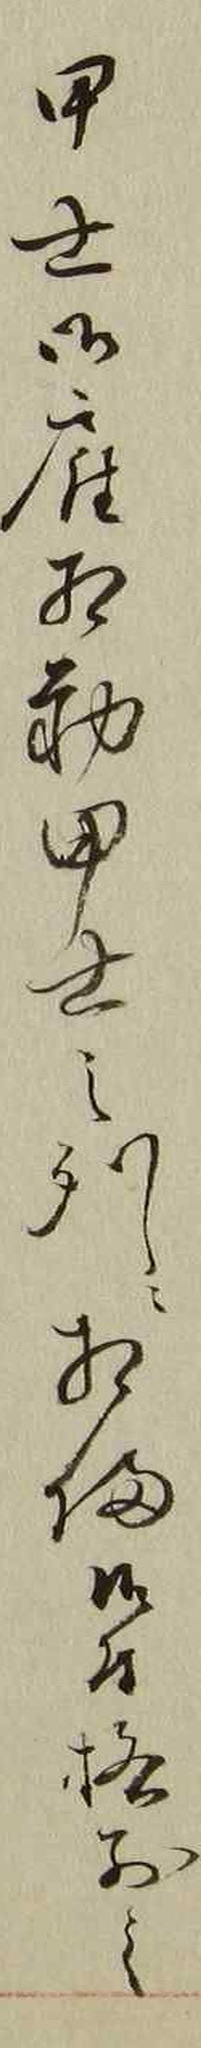甲士御雇相勤甲士之列に相備候に付格別之
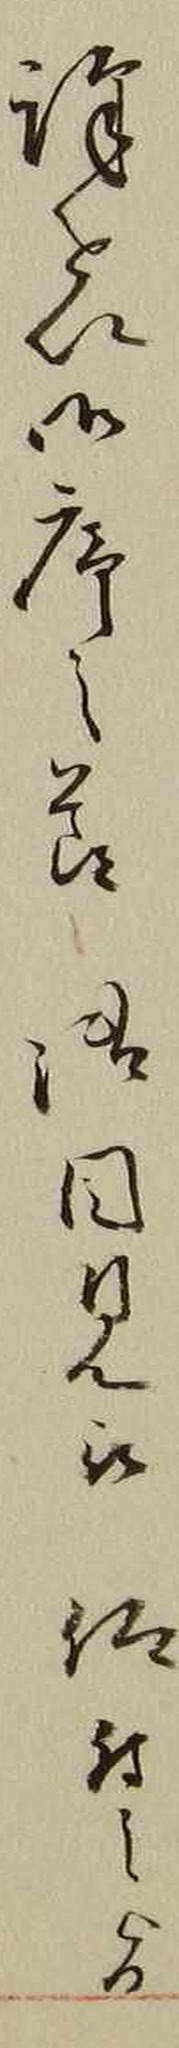訳を以御序之節御目見被仰付之旨
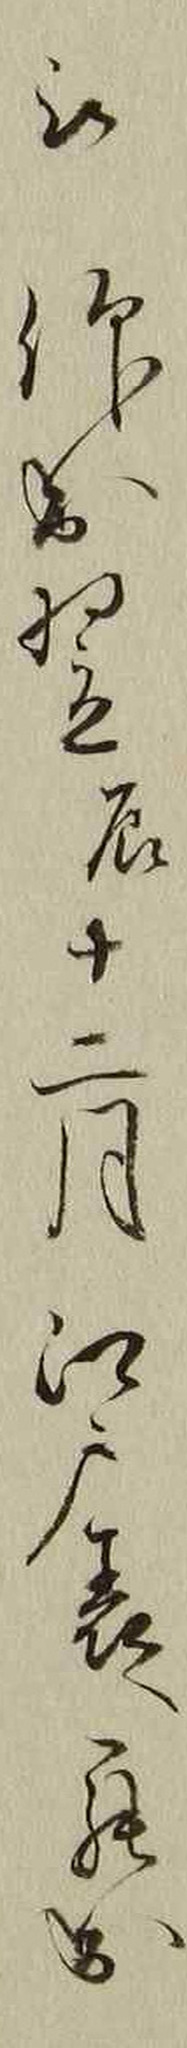被仰出翌辰十二月江戸表へ罷出
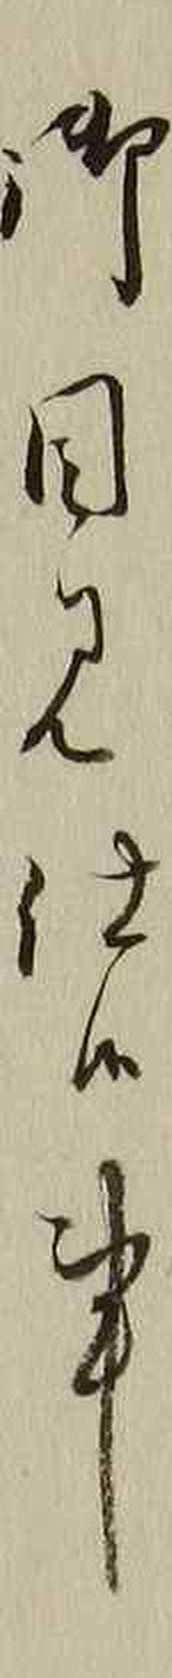御目見仕候事
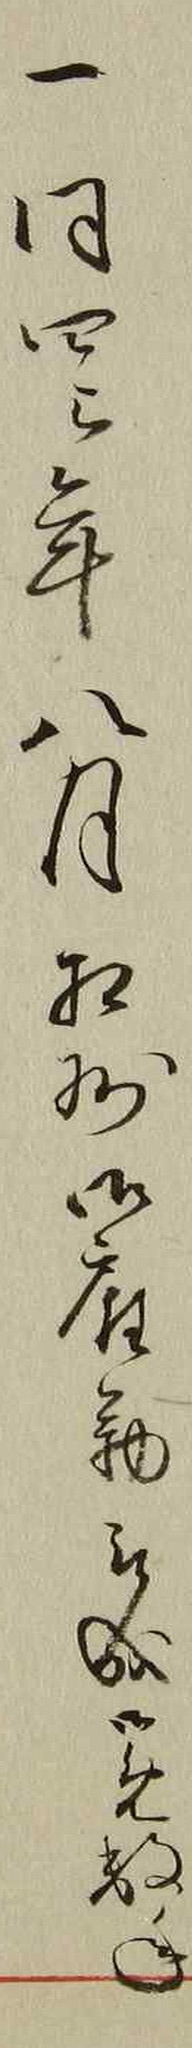一同四巳年八月相州御雇勤被成御免数年
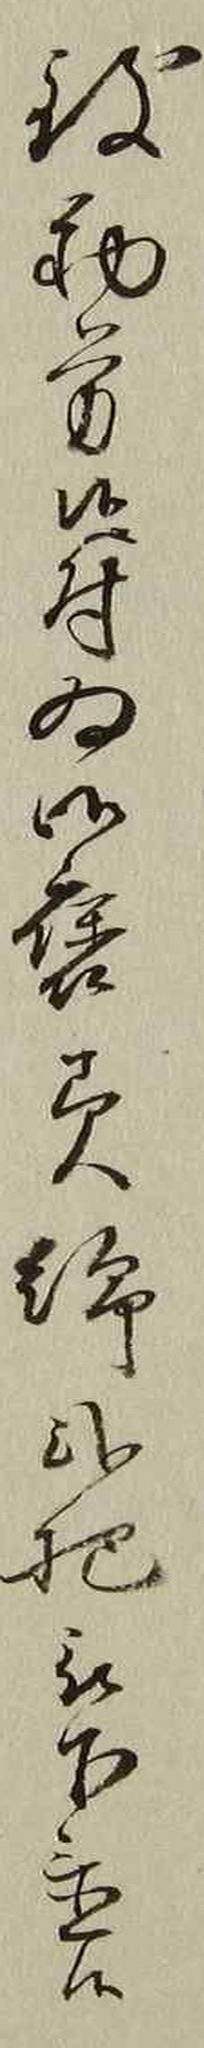致勤労候に付為御褒美綿弐把被下置候
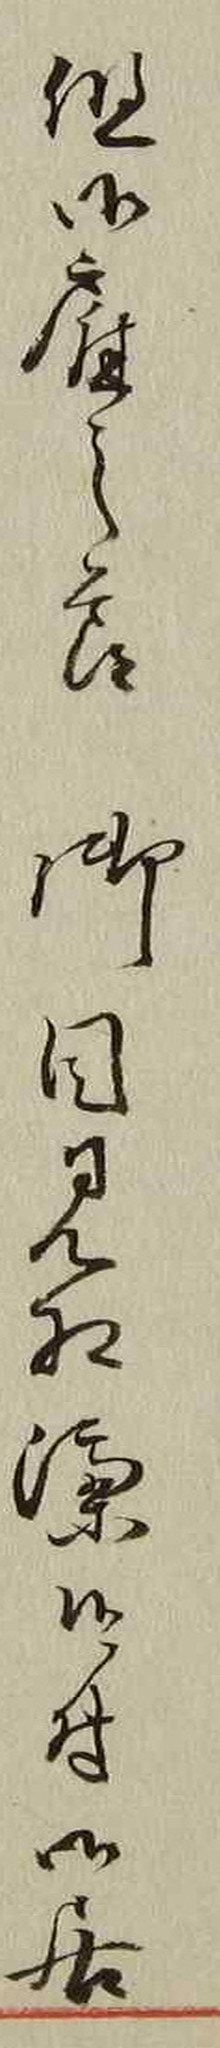但御雇之節御目見相済候に付御居
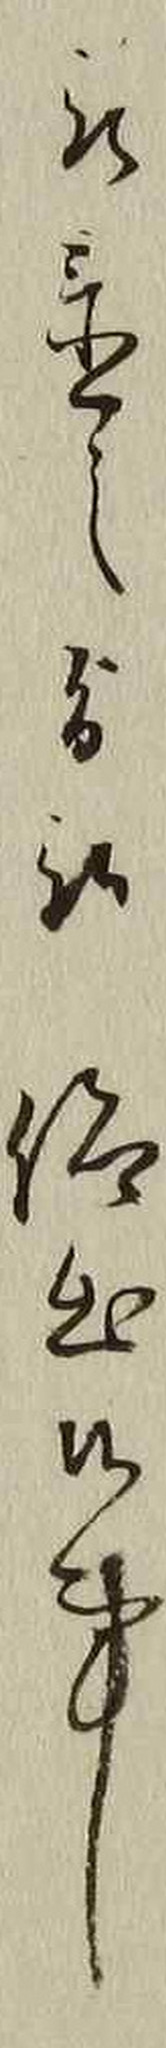被置之旨被仰出候事
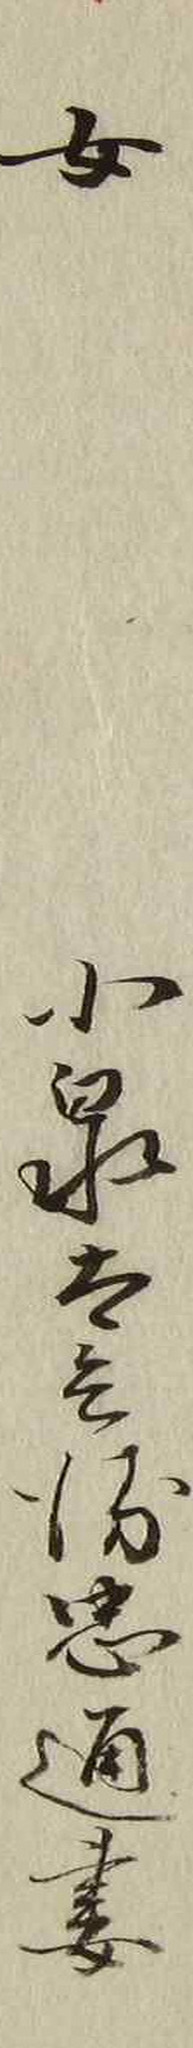女小泉太兵衛忠通妻
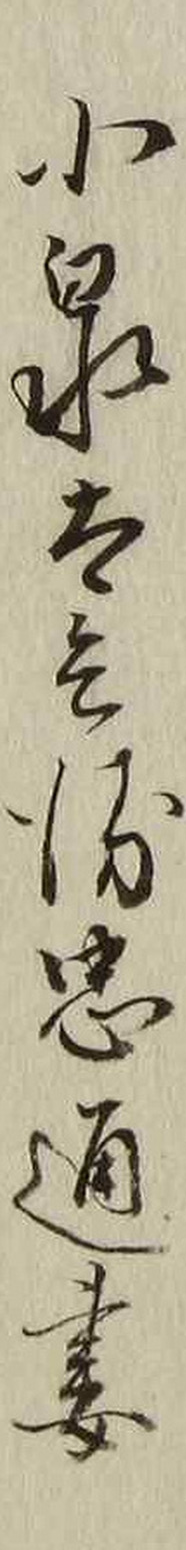女小泉太兵衛忠通妻
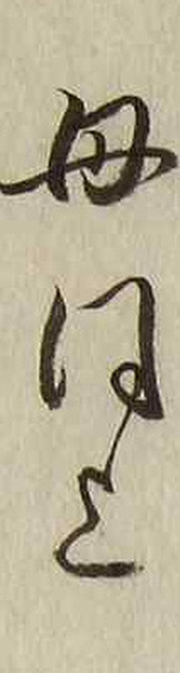母同上
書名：諸士系譜　巻之3　い之部3
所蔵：会津若松市立会津図書館
